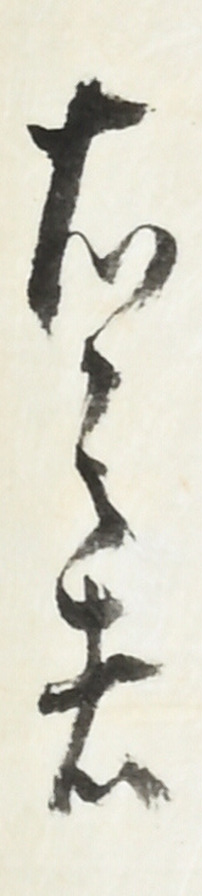右之者
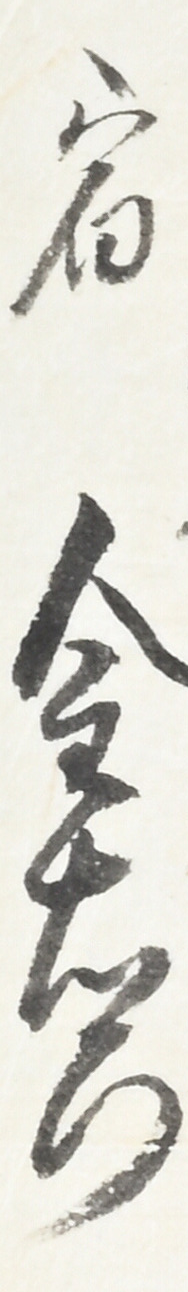宿金右衛門
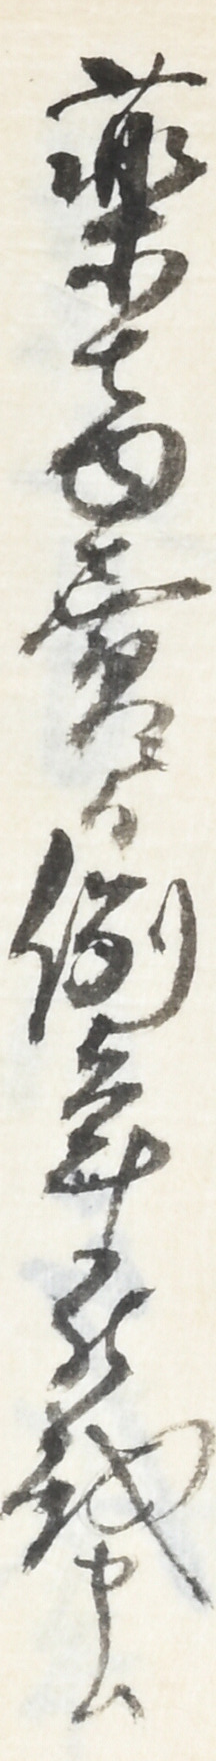傘商売ニ而例年罷越申候

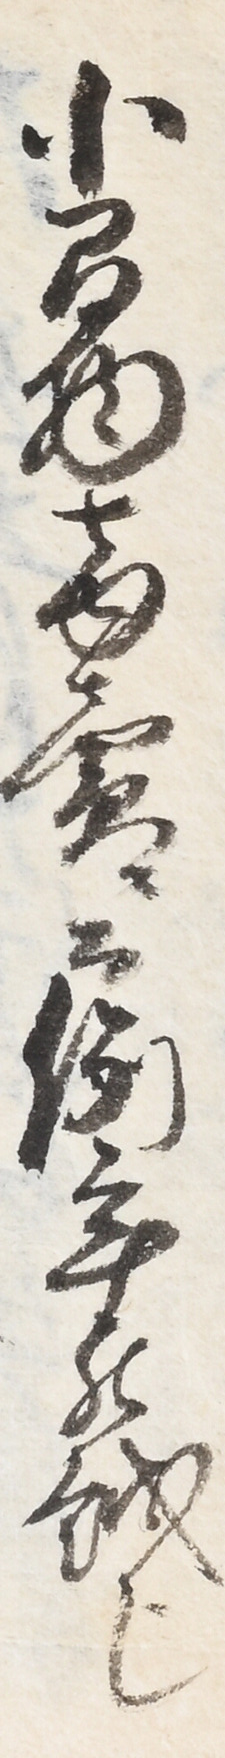打物商売ニ而例年罷越申候
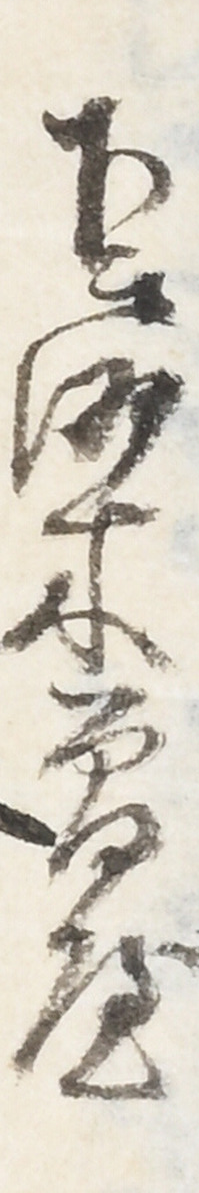下モ町木曽屋
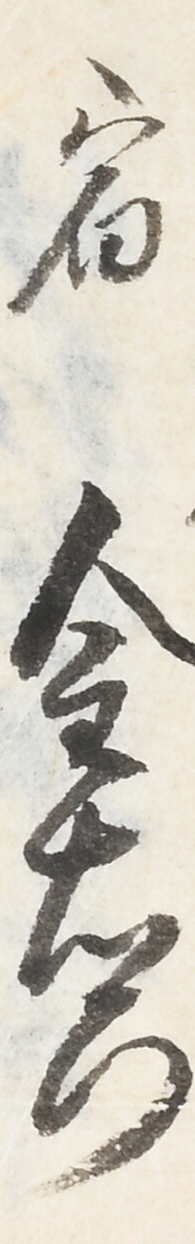宿金右衛門
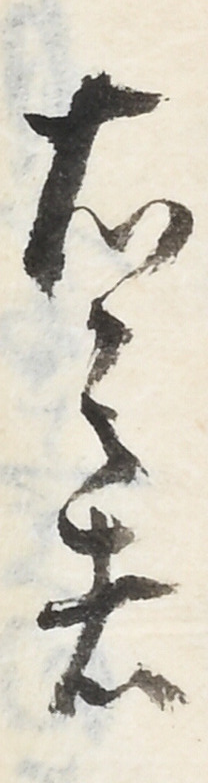右之者
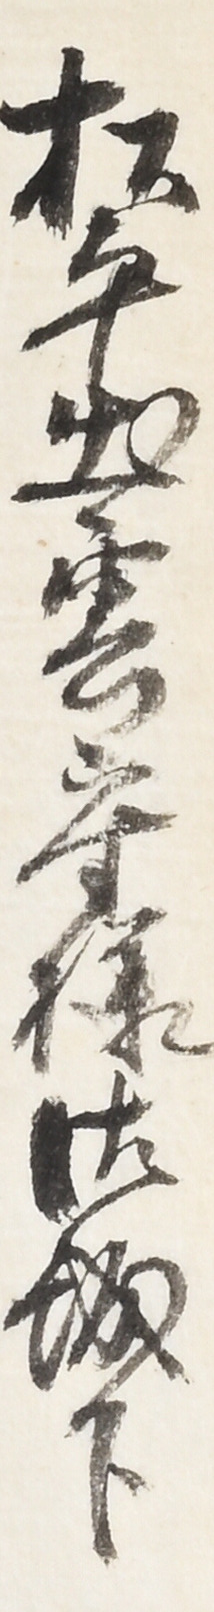松平出雲守様御城下
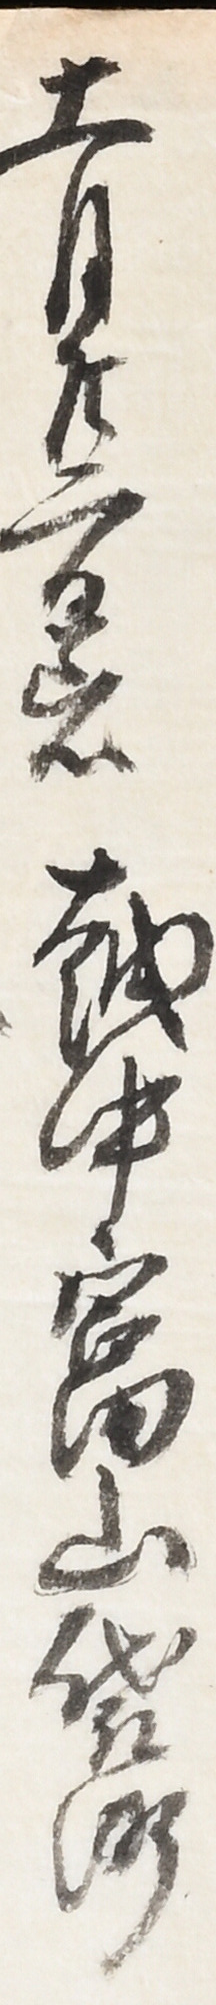十一月廿二日着越中富山袋町
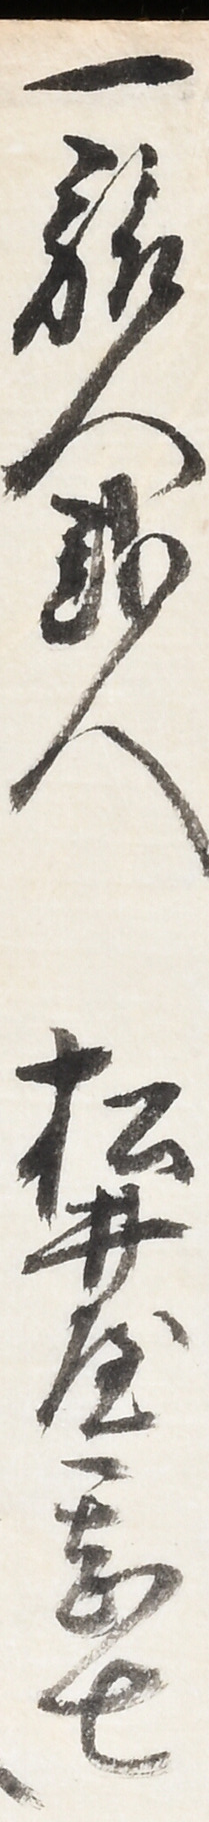一旅人弐人松井屋甚七
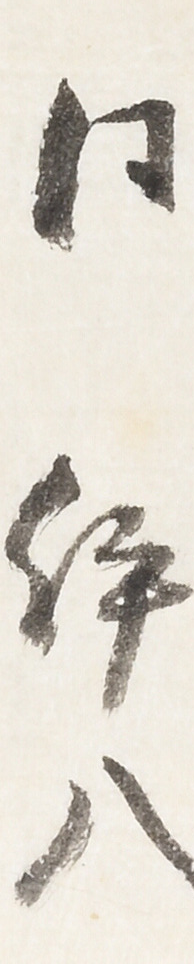同伊八
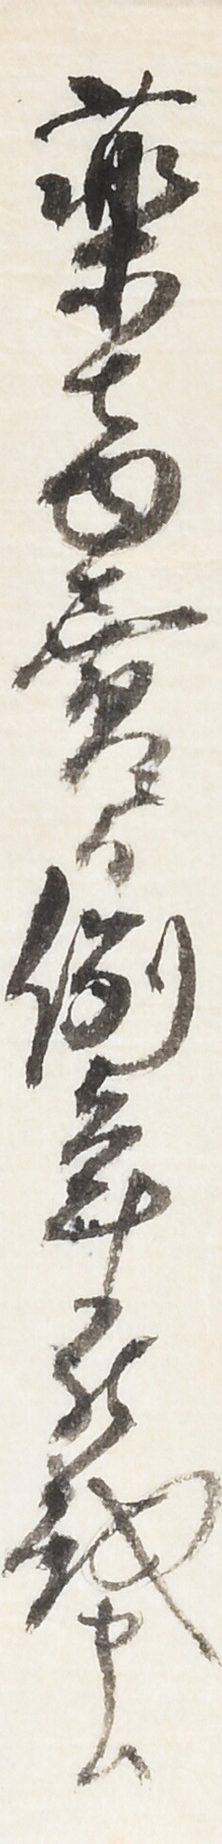薬商売ニ而例年罷越申候
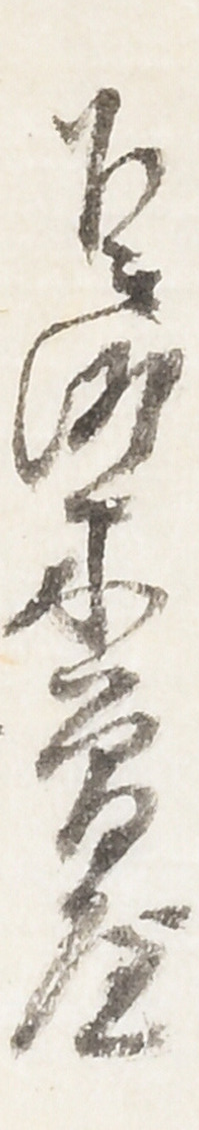下モ町木曽屋
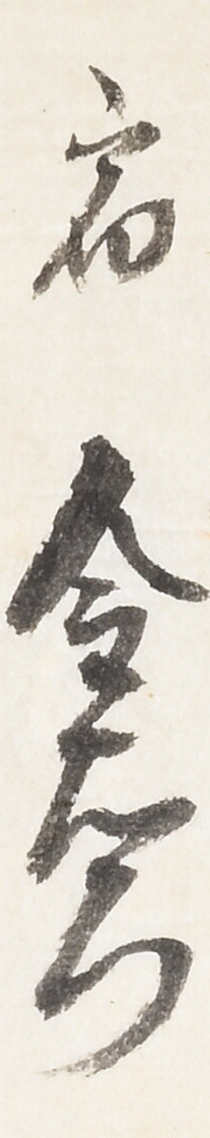宿金右衛門
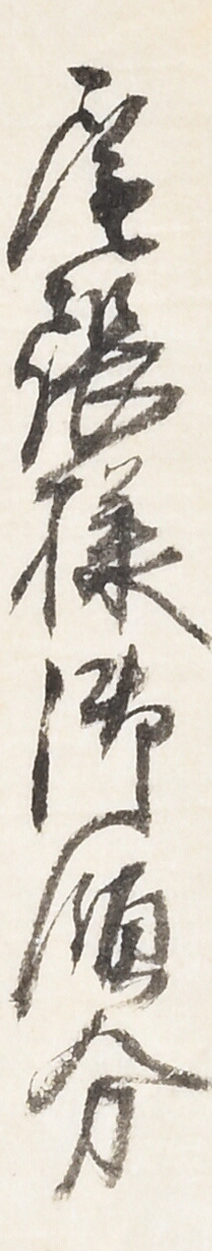尾張様御領分
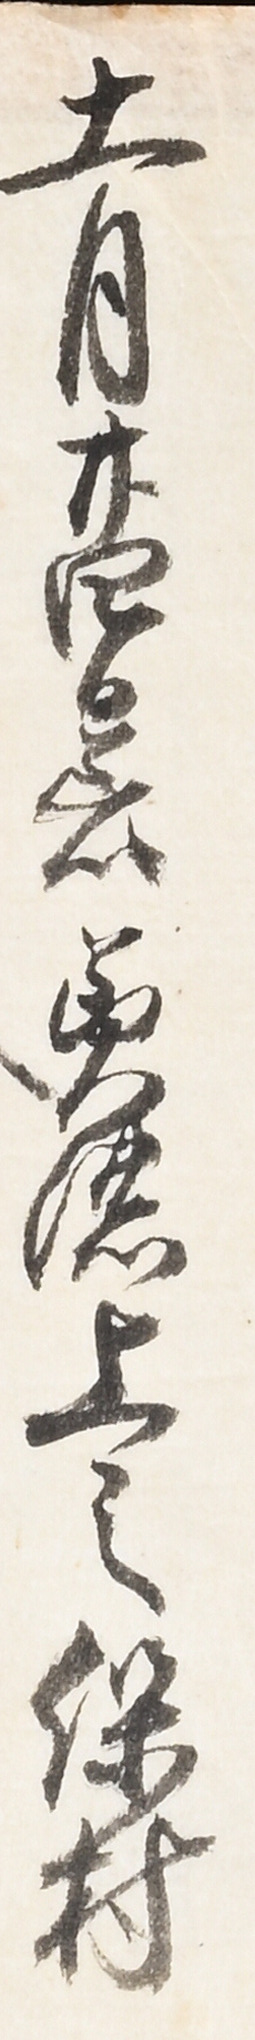十一月廿四日着美濃上之保村
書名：旅人泊控帳
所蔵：伊那市立高遠町図書館・合同会社AMANE
